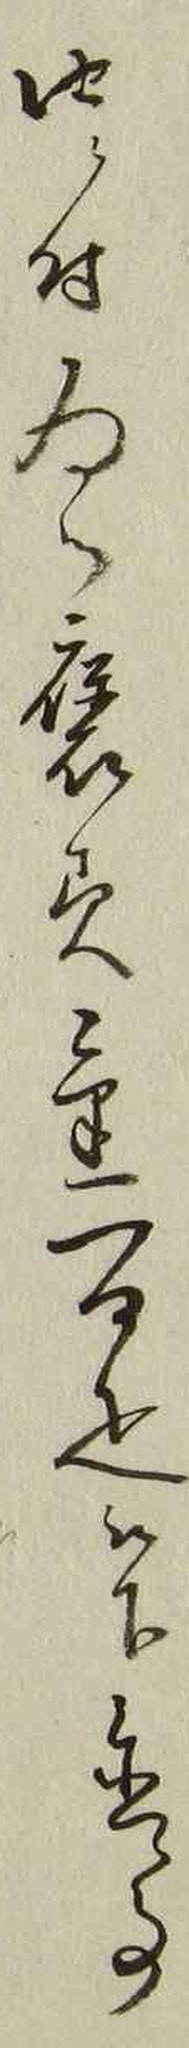由ニ付為御褒美金百疋被下置候事
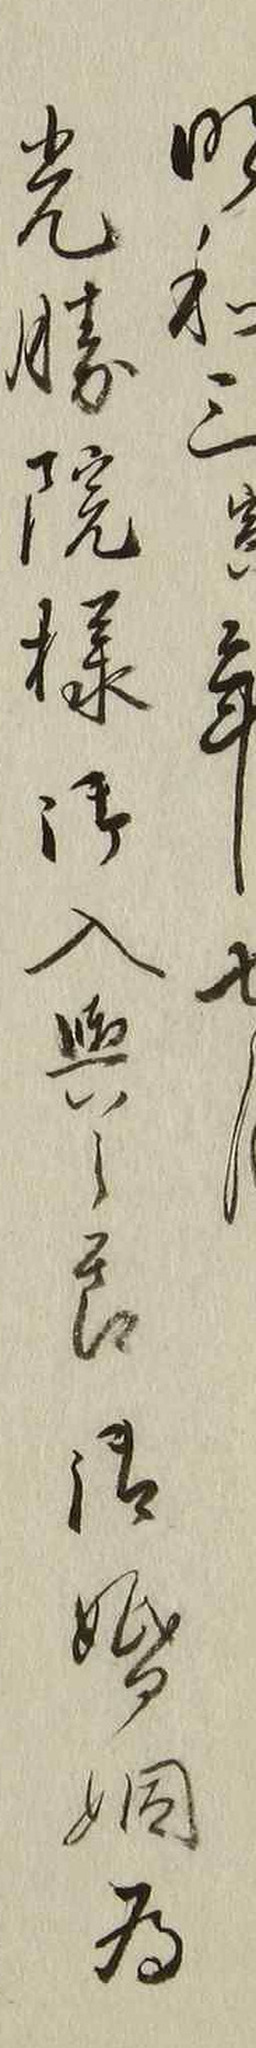光勝院様御入輿之節御婚姻為
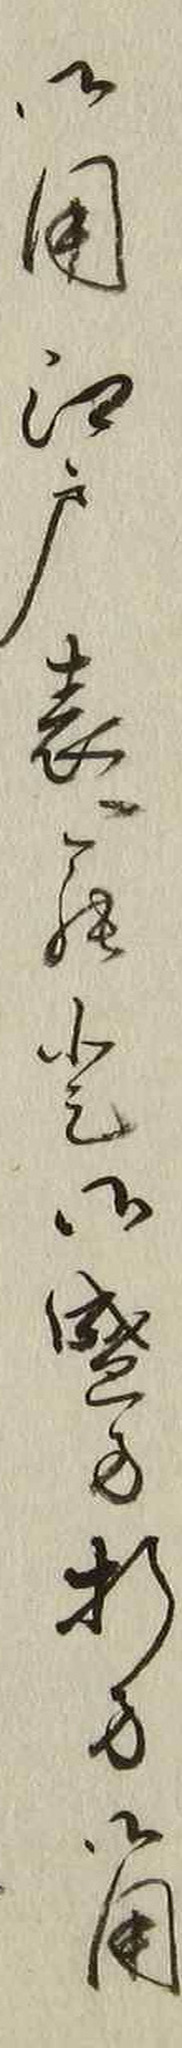御用江戸表罷登御盛方折方御用
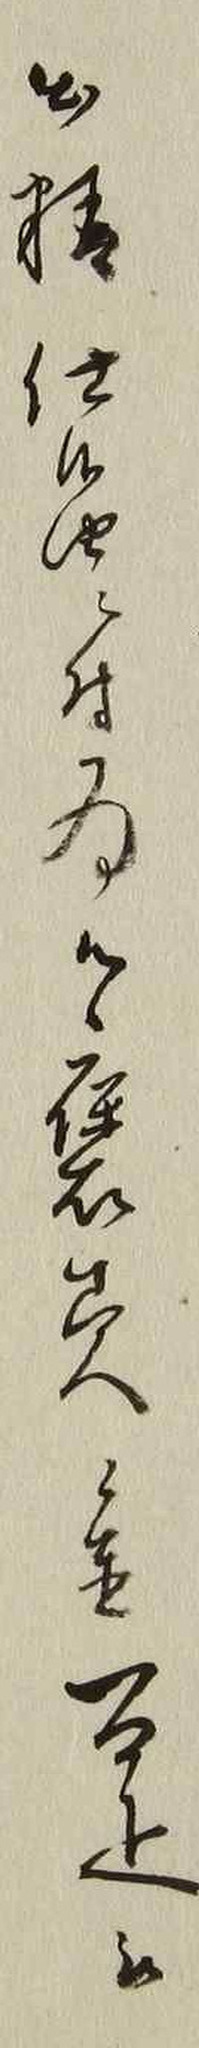出精仕候由ニ付為御褒美金百疋被
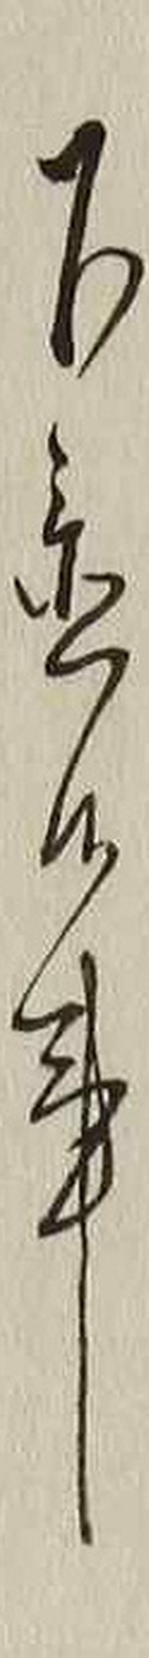下置候事
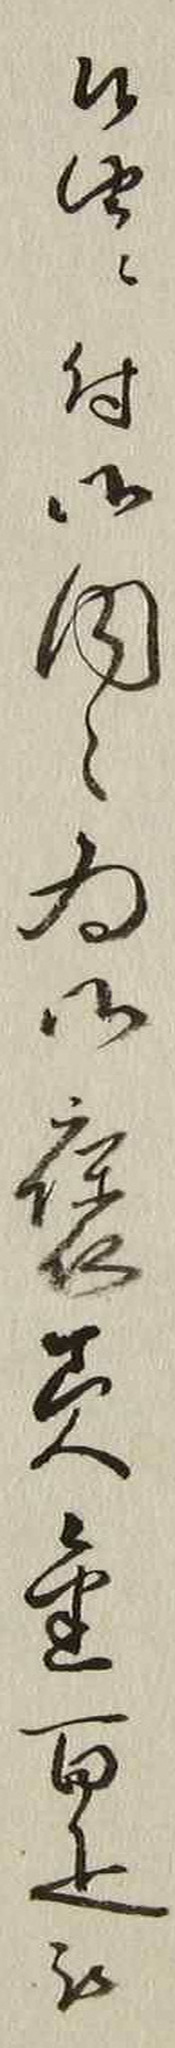候由ニ付御内々為御褒美金百疋被
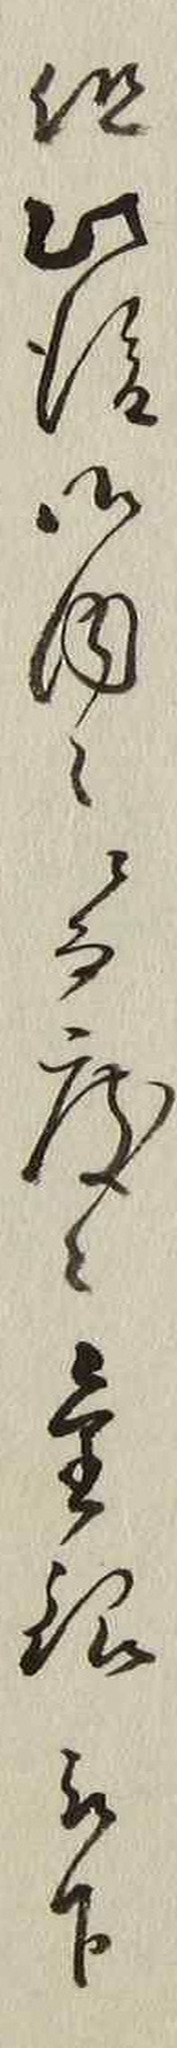但此後御内々ニ而度々金銀被下
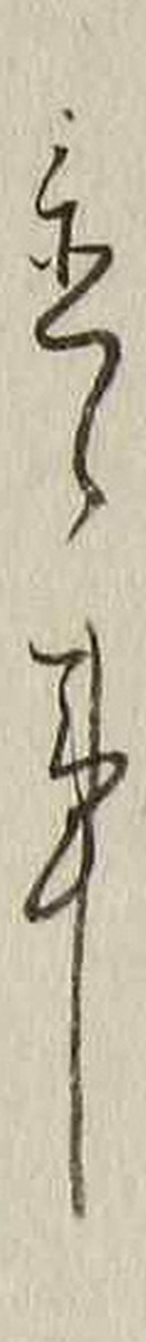置候事
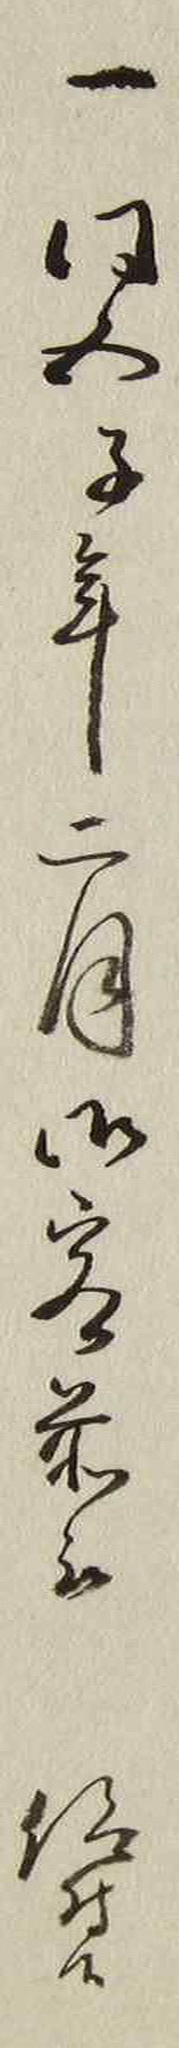一同五子年二月御客前被仰付候
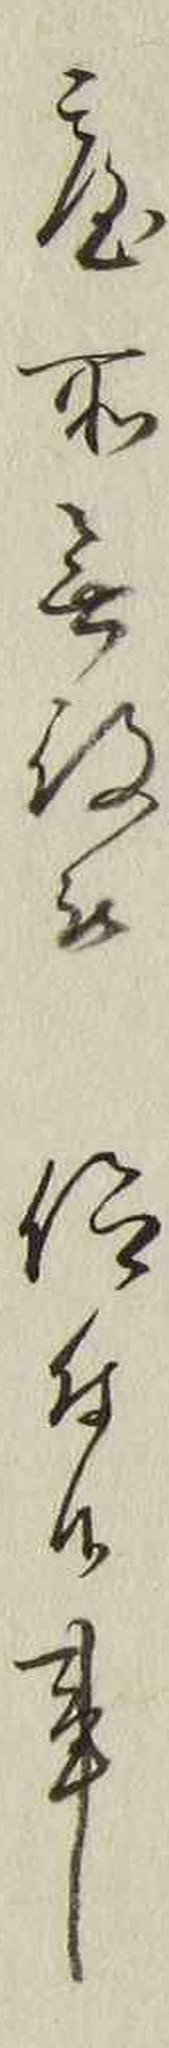台所無役被仰付候事

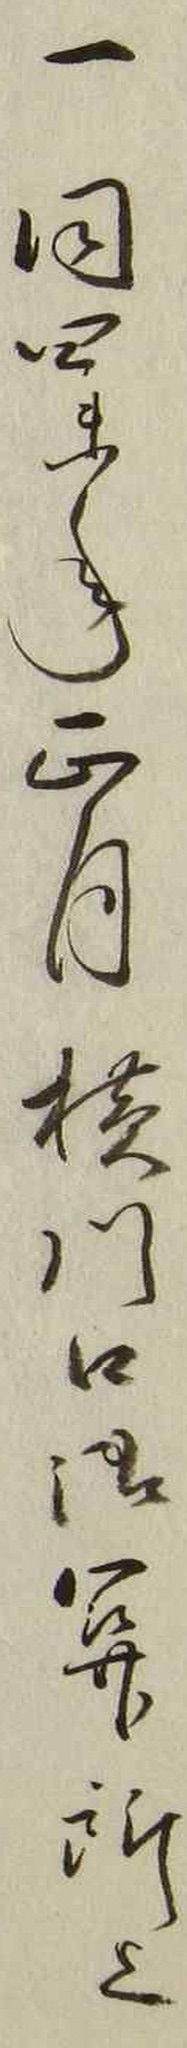一同四未年正月横川口御関所上
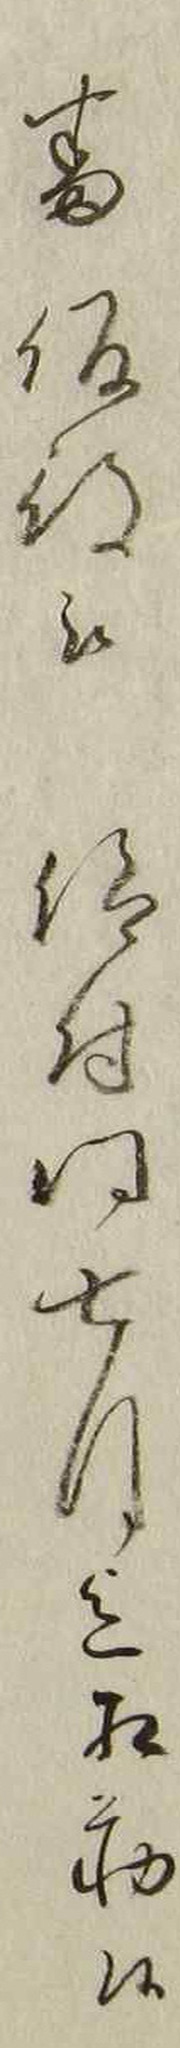番仮役被仰付同七月迄相勤候
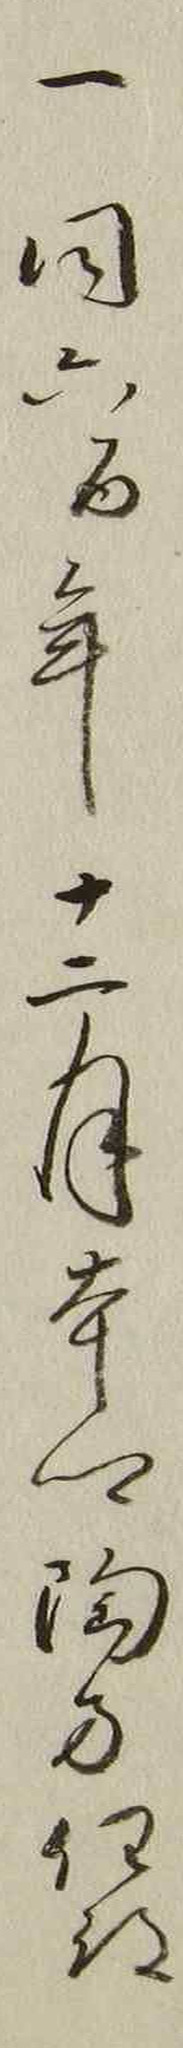一同六酉年十二月本郷陶方任役
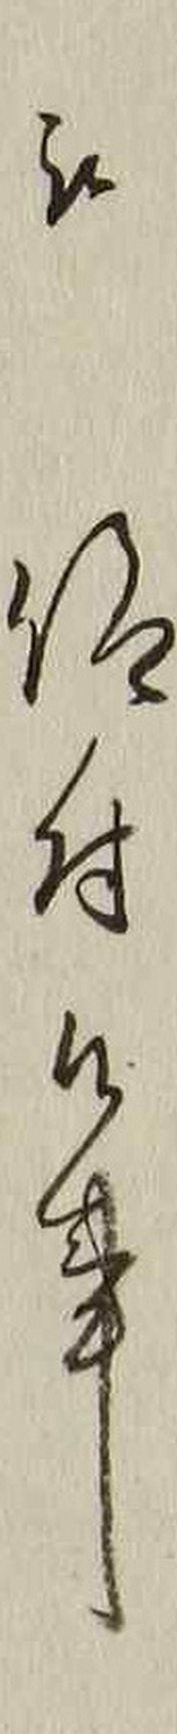被仰付候事
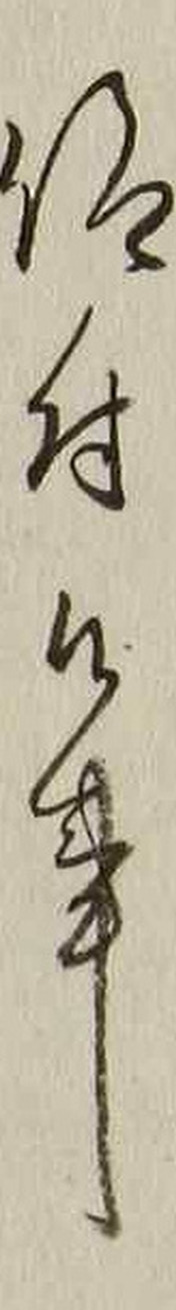仰付候事
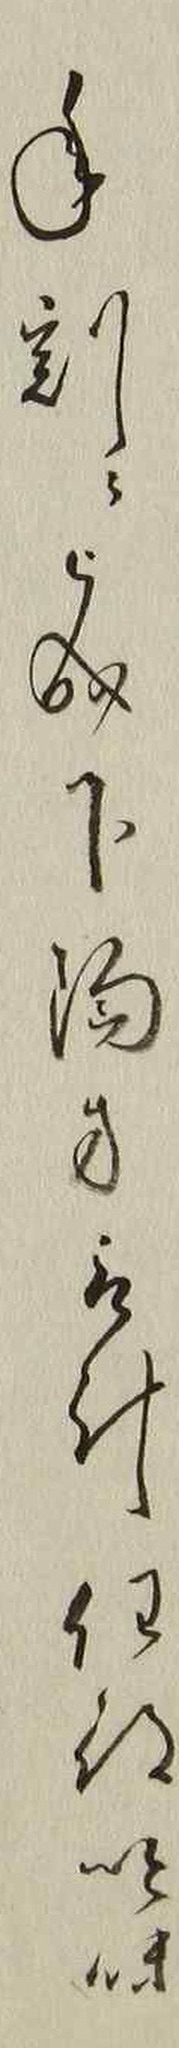年割ニ被成下陶方取計任役吟味
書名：諸士系譜　巻之10　い之部10
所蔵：会津若松市立会津図書館
